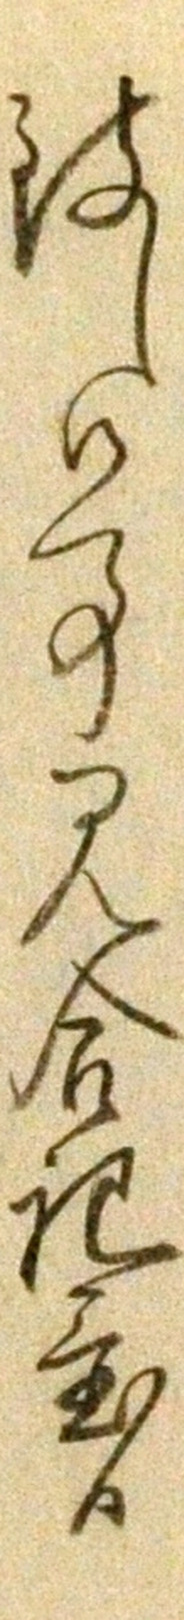致し候事見合記置候
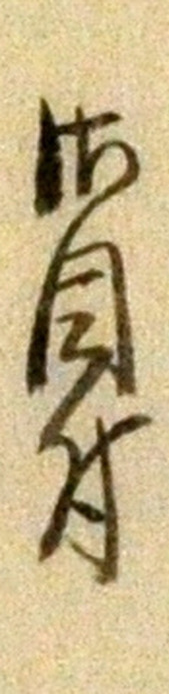御目付
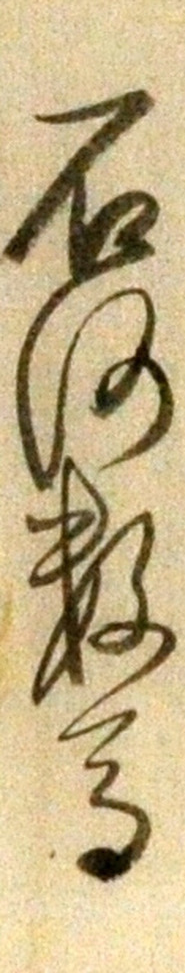石河数馬
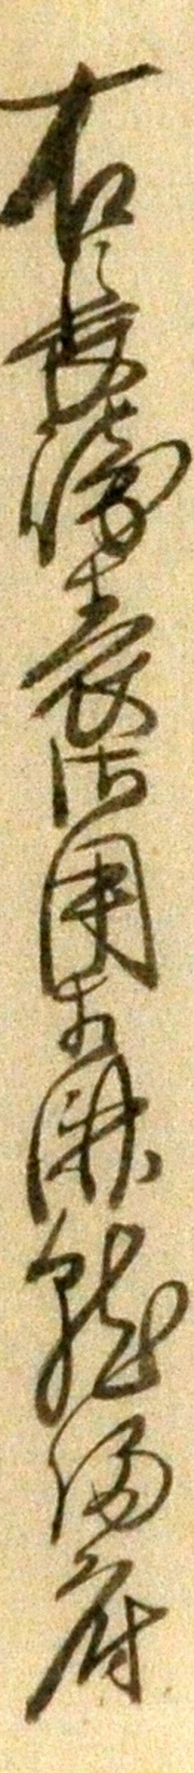右長崎表御用相済就帰府
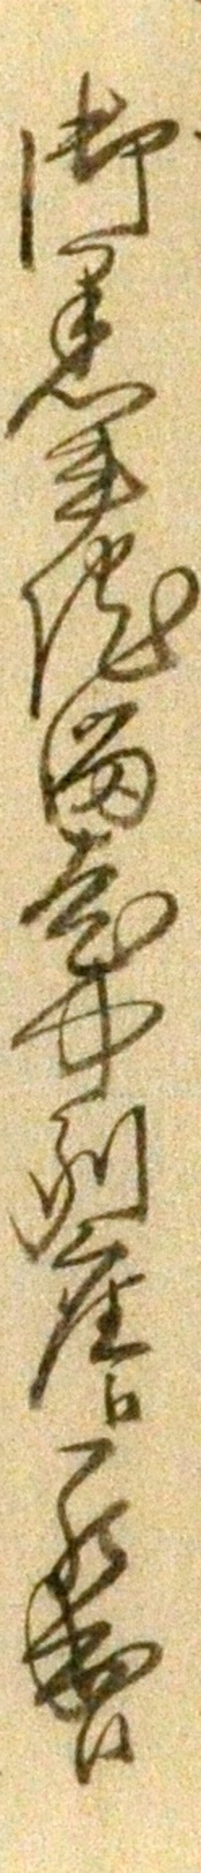御黒書院溜老中列座え罷出候
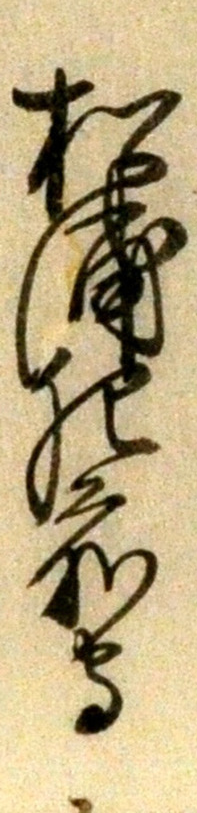松浦肥前守
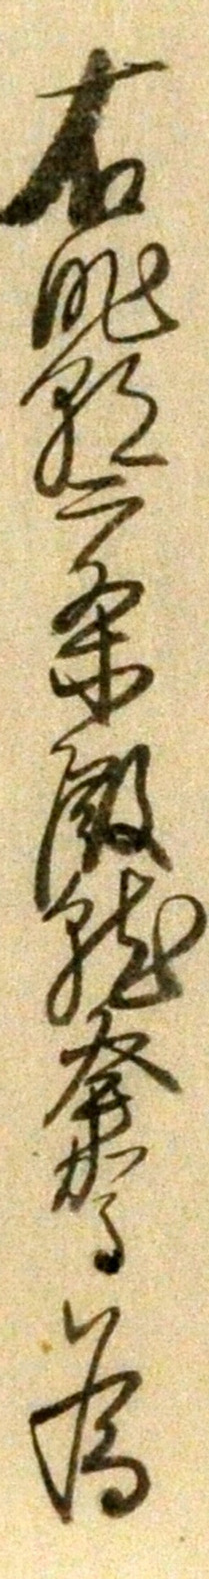右昨朝二条殿就発駕為
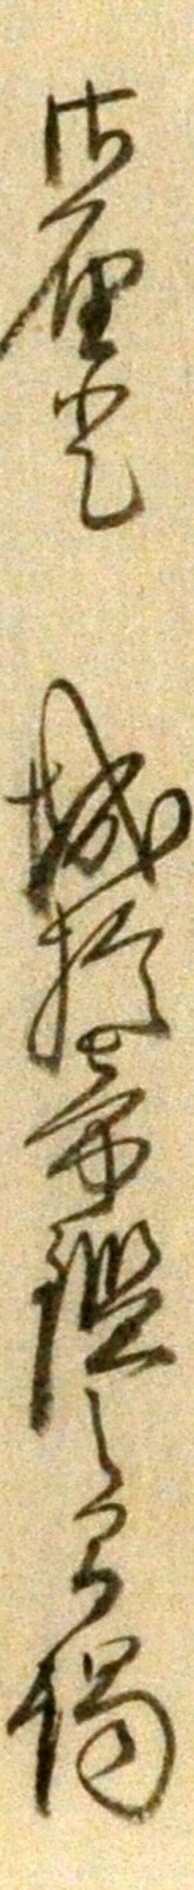御届登城於帝鑑之間謁
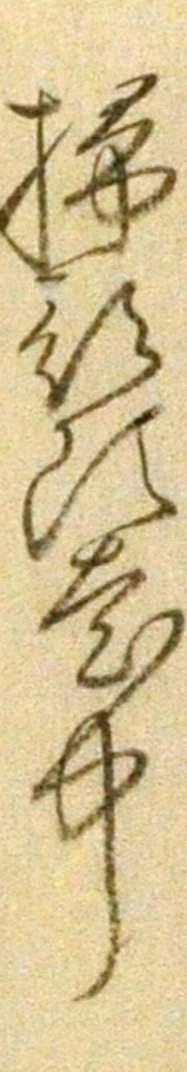掃部頭老中
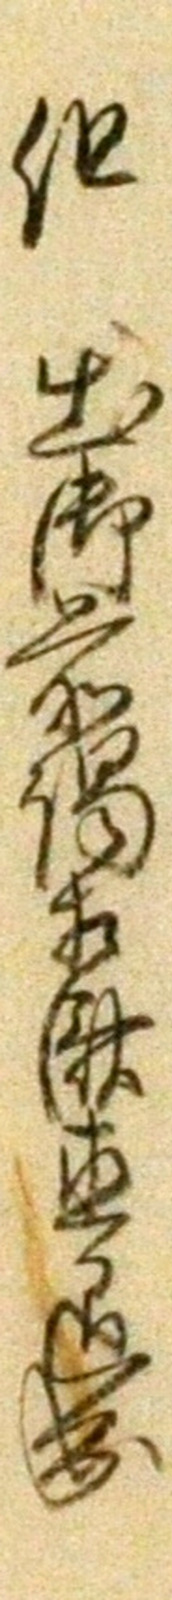但出御前謁相済直退出

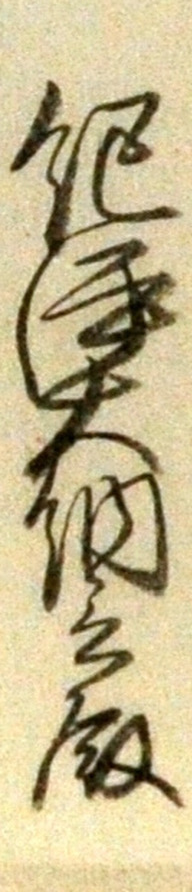紀伊大納言殿
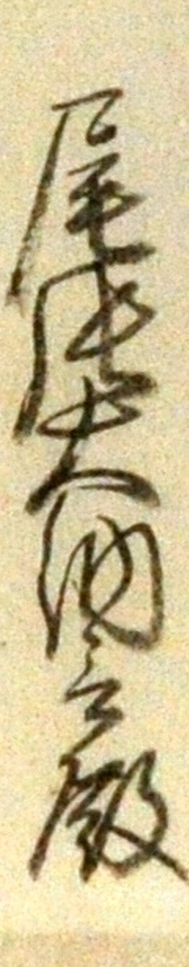尾張大納言殿
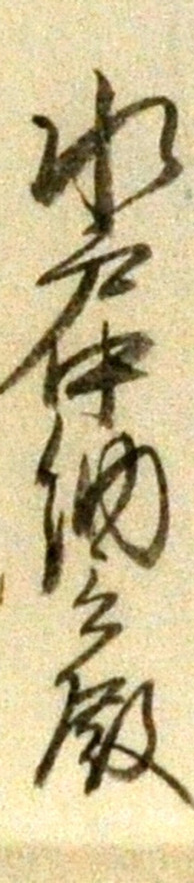水戸中納言殿
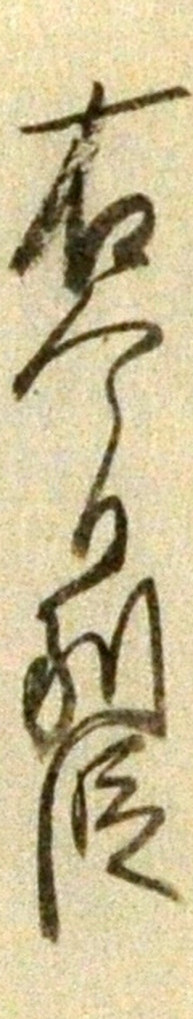右今日別段
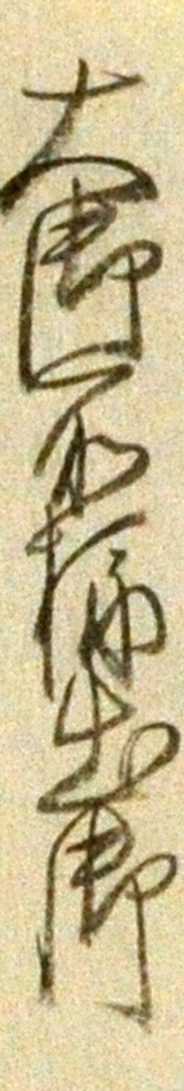大御所様出御
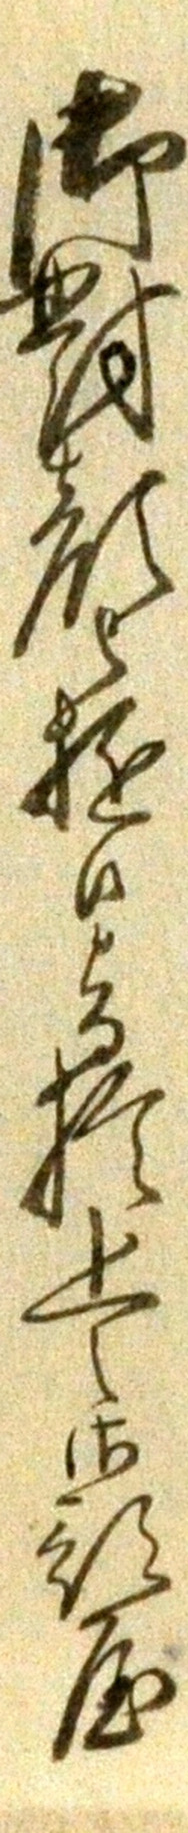御対顔被遊候旨於上之御部屋
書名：御馳走御能ノ節ノ留外
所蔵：伊那市立高遠町図書館・合同会社AMANE
